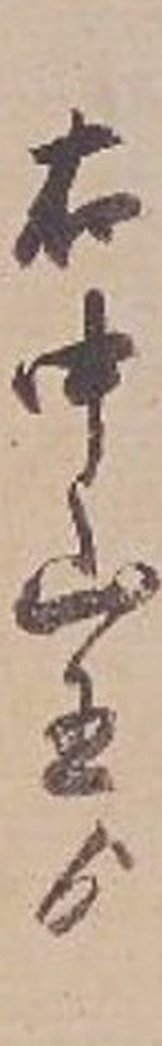右中山王ゟ
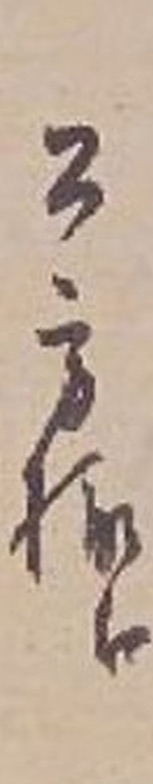公方様え
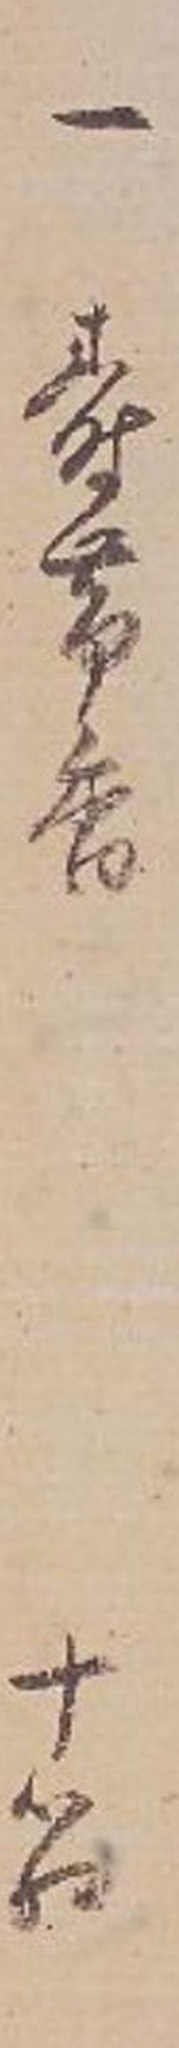一寿帯香十箱
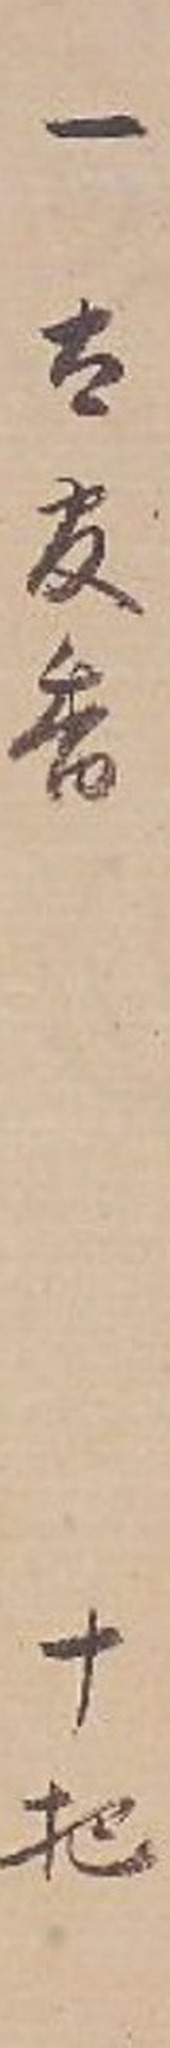一太官香十把
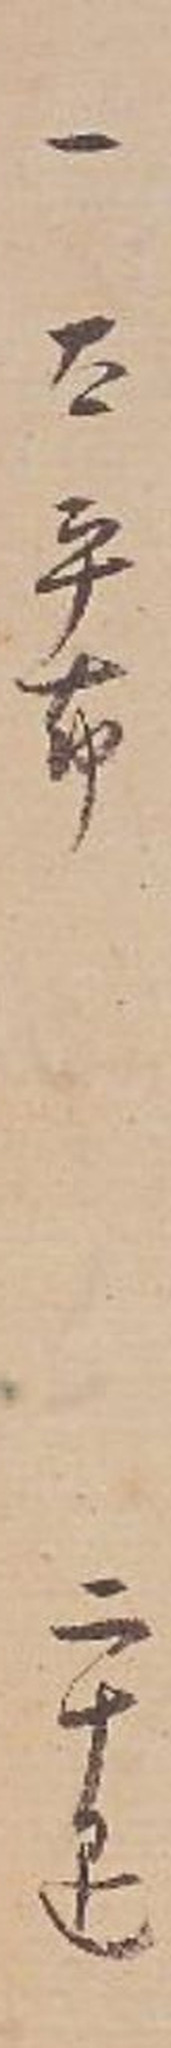一太平布二十疋
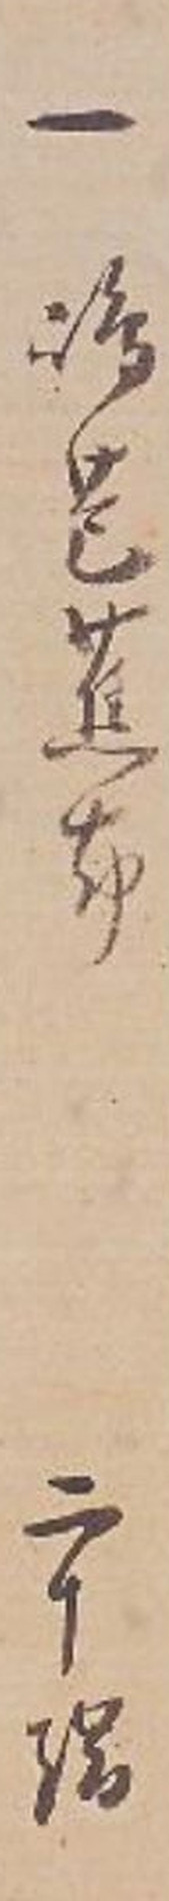一島芭蕉布二十端
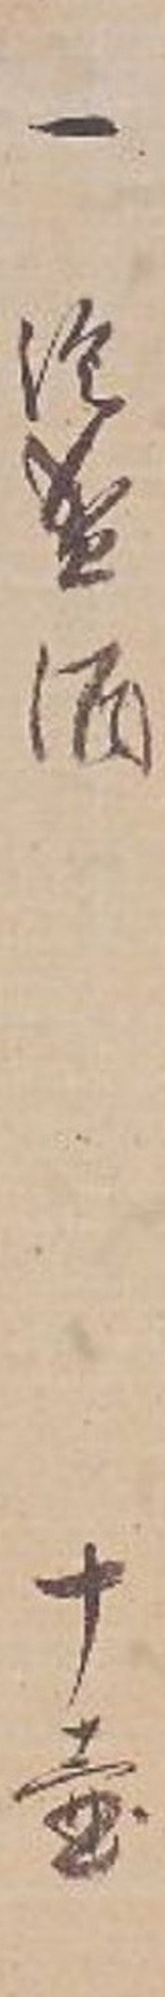一泡盛酒十壺
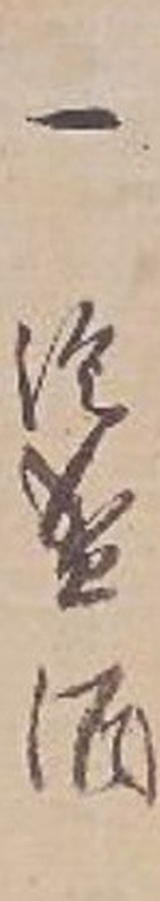一泡盛酒
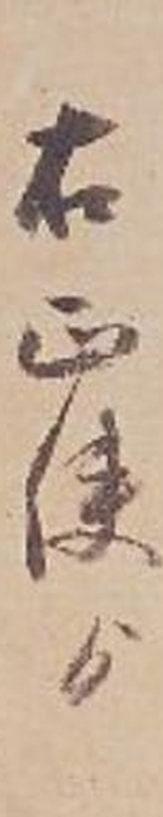右正使ゟ
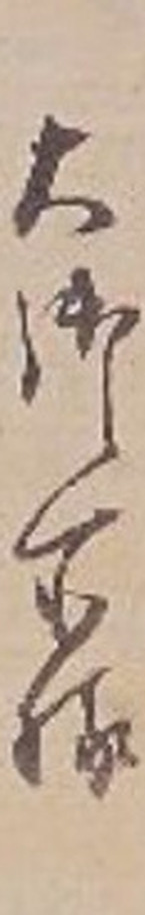大御所様
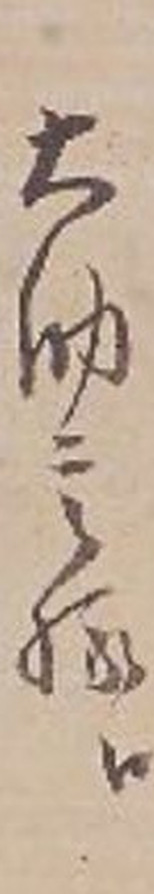大納言様え

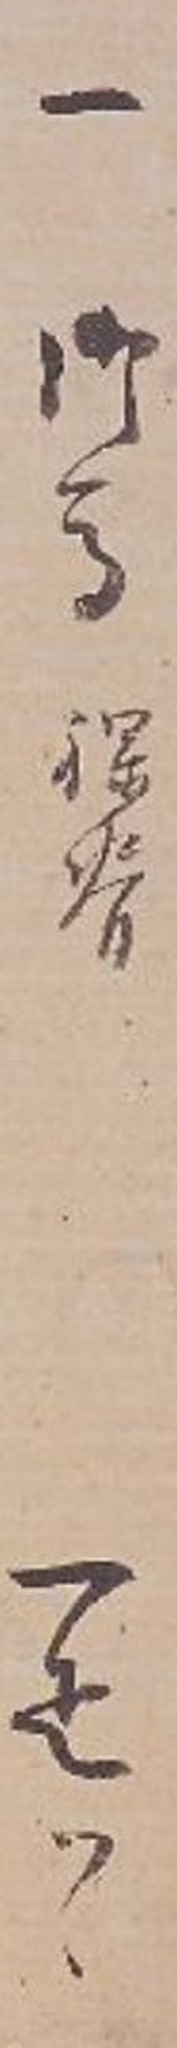一御馬裸背一疋ツヽ
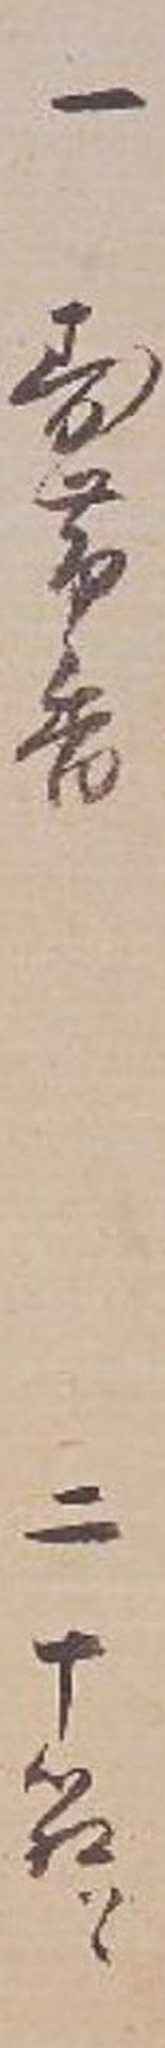一寿帯香三十箱ツヽ
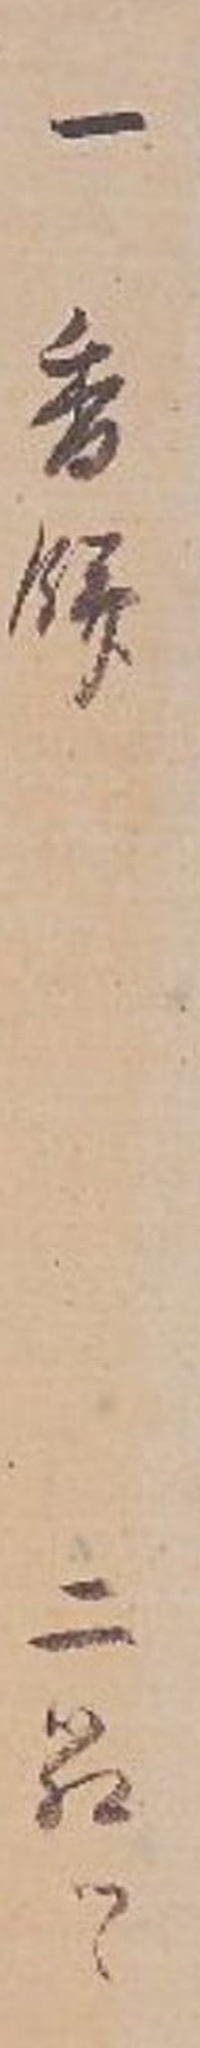一香餅二箱ツヽ
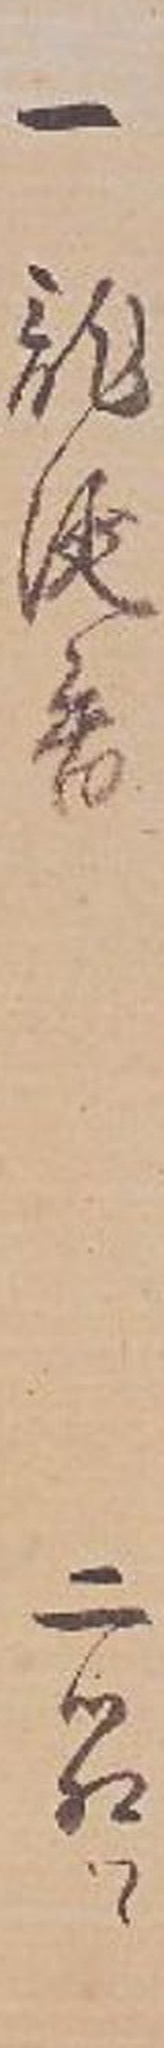一龍涎香二箱ツヽ
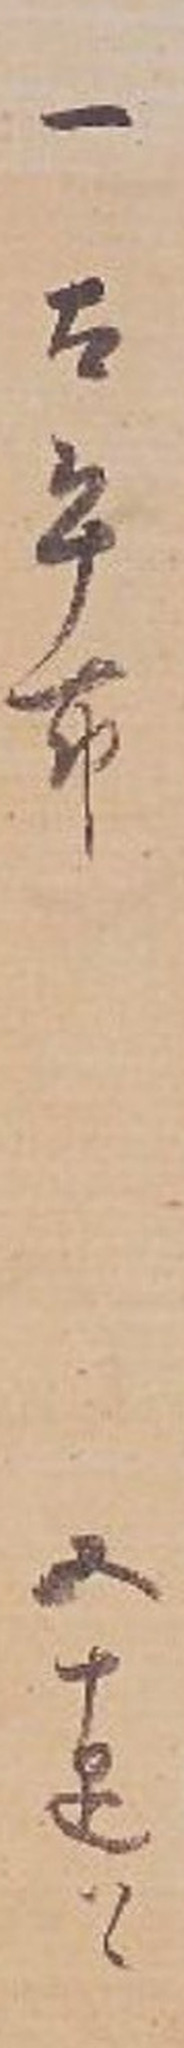一太平布五十疋ツヽ
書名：琉球人来朝記 五、六、七
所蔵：University of the Ryukyus Library
